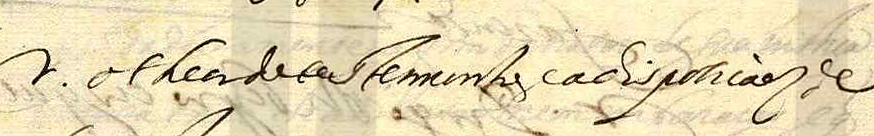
item. o theor de testemunhos e a disposiçaõ de
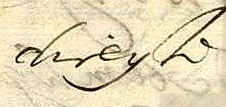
direyto
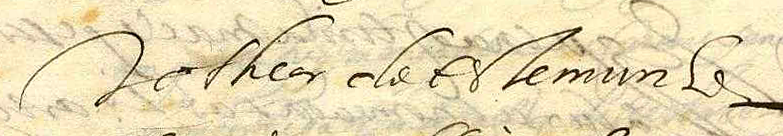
do theor do testemunhos
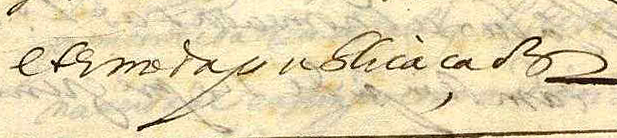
e termo da publicaçaõ
